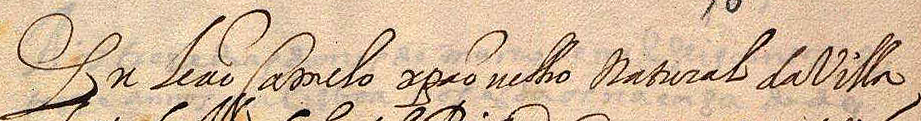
Eu leaõ Camelo xpaõ uelho natural da Villa
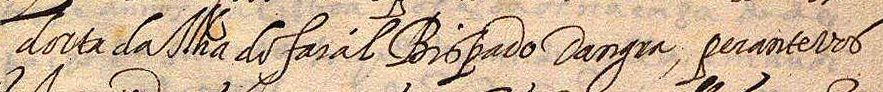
dorta da Ilha do faial Bispado Dangra, perante vos
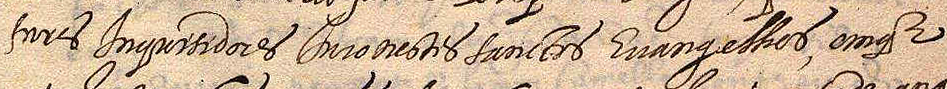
snres Inquisidores Iuro nestes sanctos Euangelhos, em q̄
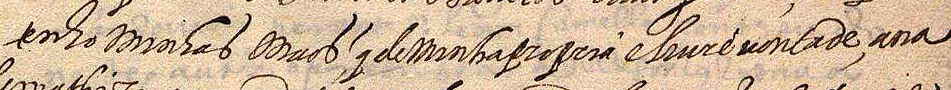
tenho minhas maõs, q̄ de minha propria e liure uontade, ana
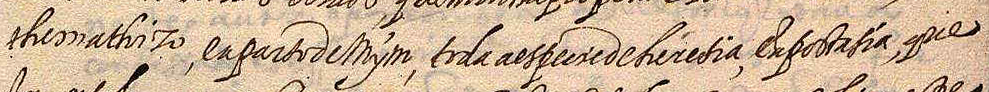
thematizo, e aparto de mym toda a especie de heresia, e apostasia, que
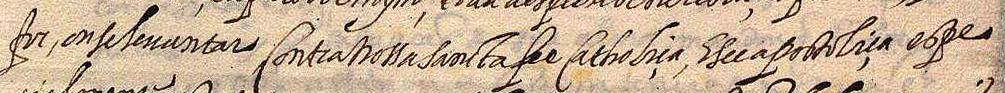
for, ou se leuantar Contra nossa sancta fee Catholica, E see apostolica espe
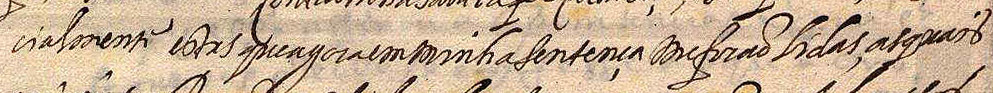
cialmente estas que agora em minha sentença me foraõ lidas, as quais
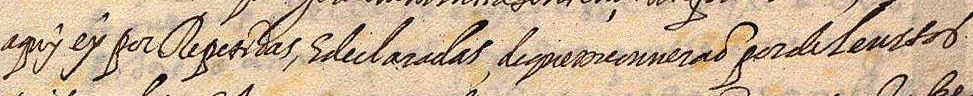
aquy ey por Repetidas, E declaradas, de que me ouueraõ por de leui sos
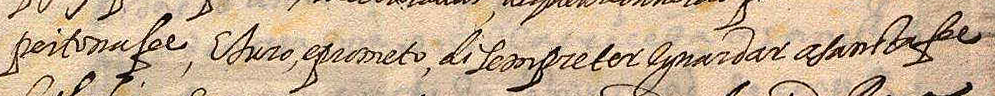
peito na fee, E Iuro, e prometo, de sempre ter guardar a sancta fee
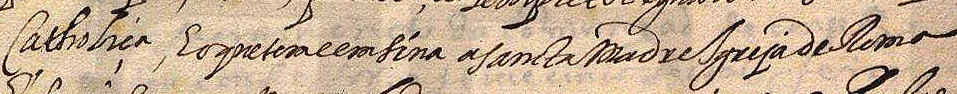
Catholica, e o que tem e emsina a sancta madre Igreja de Roma
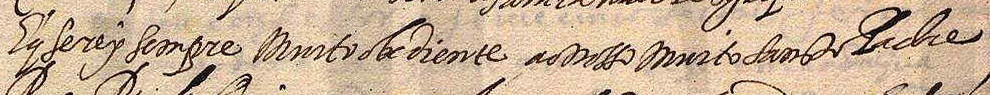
E q̄ serey sempre muito obediente ao nosso muito sancto Padre
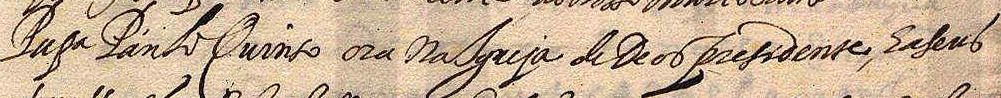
Papa Paulo Quinto ora na Igreja de Deos presidente, E a seus
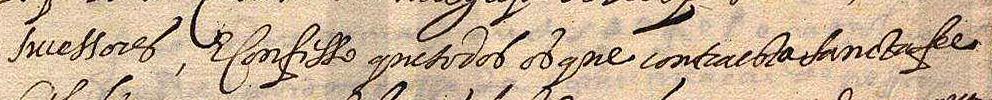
sucessores, E Confesso que todos os que contra esta sancta fee
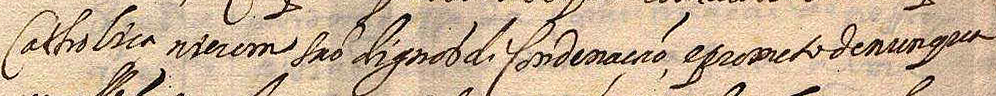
Catholica vierem saõ dignos de Condenaçaõ, e prometo de nunqua
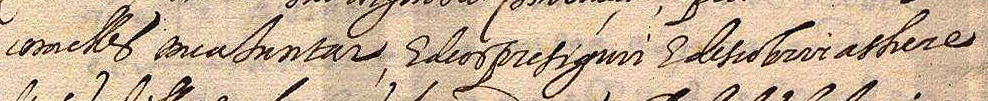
com elles me ajuntar, E de os preseguir E descobrir as here
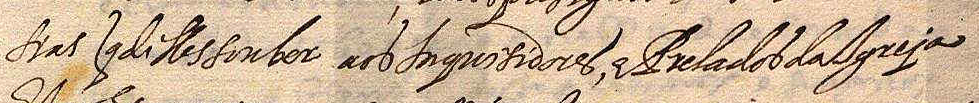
sias q̄ delles souber aos Inquisidores, E Prelados da Igreja
